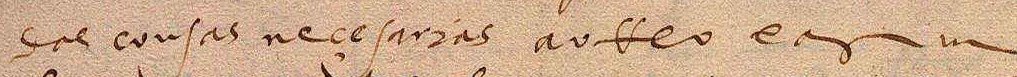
das cousas neçesarias ao Reo e a seu
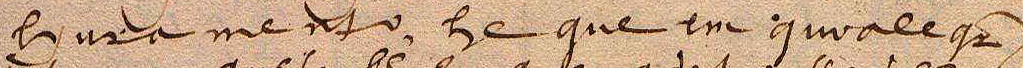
lyuramento he que em quoallqr̄
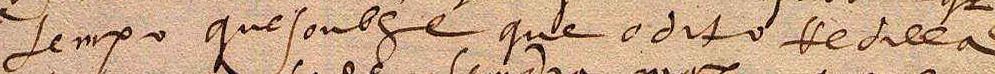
tempo que soubese que o dito Re della
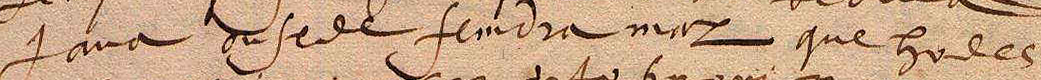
taua ou se defemdia maL que ho des
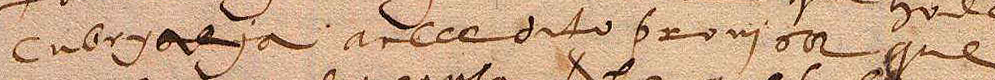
cubry_ja a elle dito proujsor que
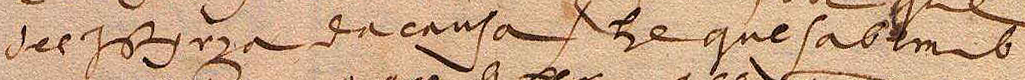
desJstyrja da causa / he que sabemdo
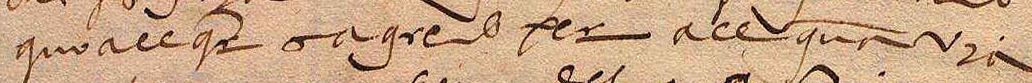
quoallqr̄ sagredo per allgūa vja
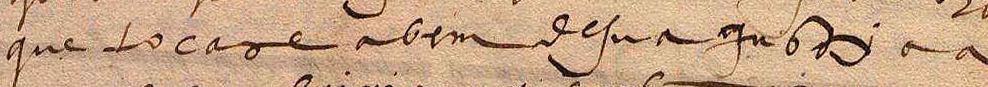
que tocase a bem de sua Justyca
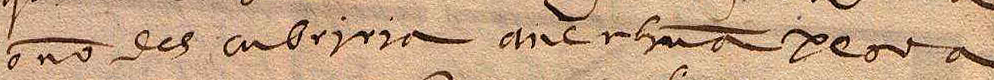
o nō descubrjria a nenhūa pesoa
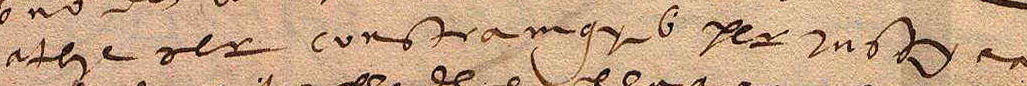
athe ter constramgydo per Justyca
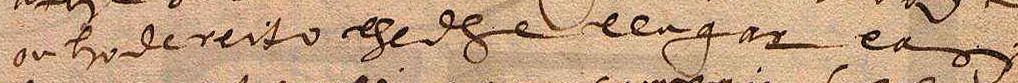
ou ho dereito lhe dese llugar e asy
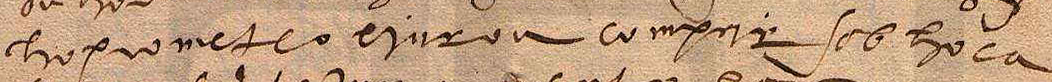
ho prometeo e jurou comprir sob ho ca
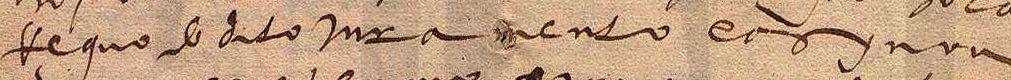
Reguo do dito Juramento e asynou
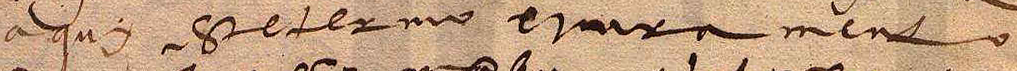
aquy este termo ljuramento
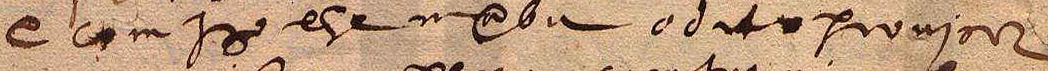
e comJgo lhe mādou o dito proujsor
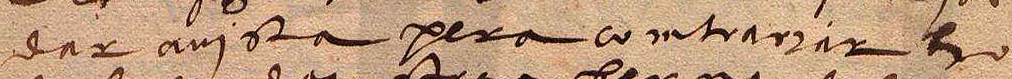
dar a ujsta pera comtrariar ho
